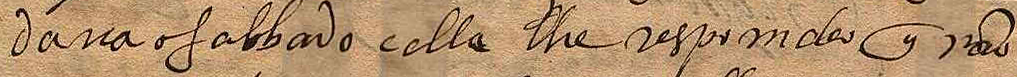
daua o sabbado e ella lhe respomdeo q̄ não
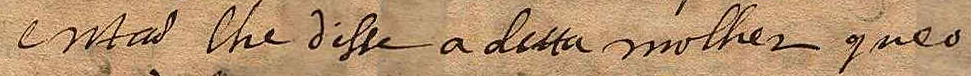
entaõ lhe disse a ditta molher que o
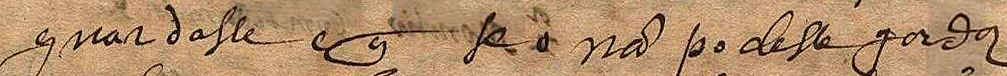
guardasse e q̄ se o não podesse gordar
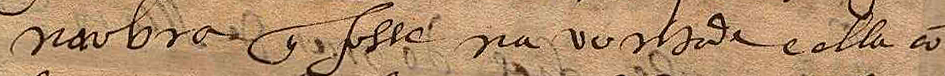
na obra q̄ fosse na vontade e ella cō
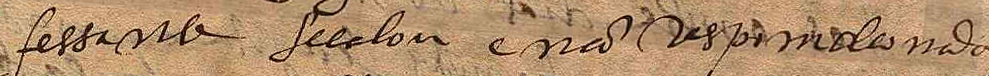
fessante se calou e não respomdeo nada
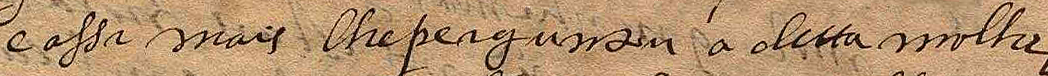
e assi mais lhe perguntou a ditta molher
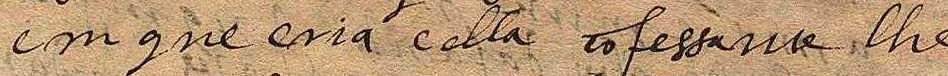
em que cria e ella cōfessante lhe
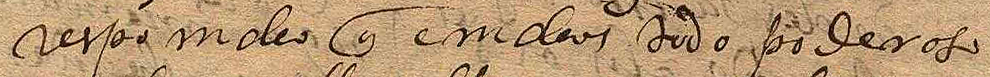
respomdeo q̄ em deos todo poderoso
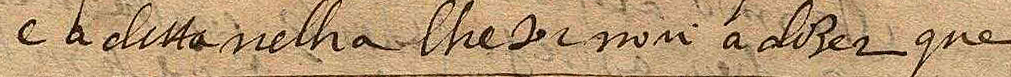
e a ditta uelha lhe tornou a dizer que
